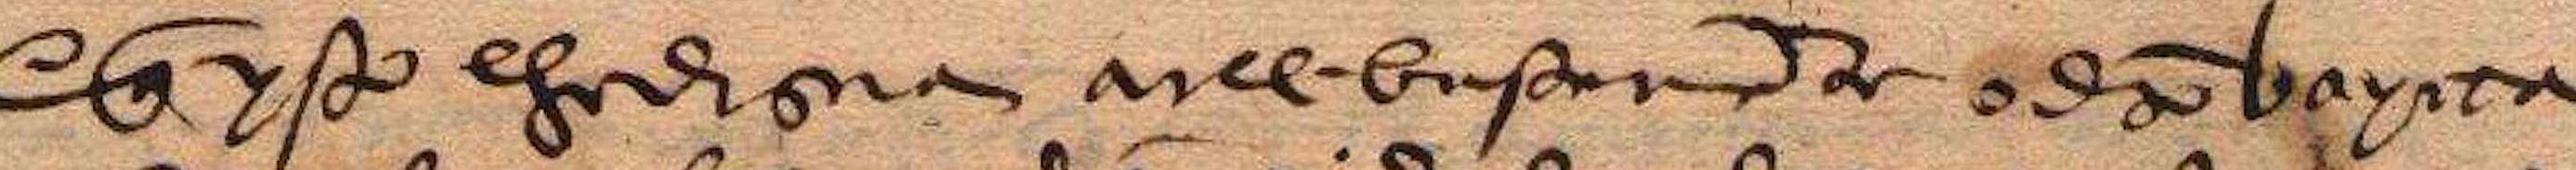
e q̄ ysto lhe disera a elle bustamāte o dt̄o bayeca
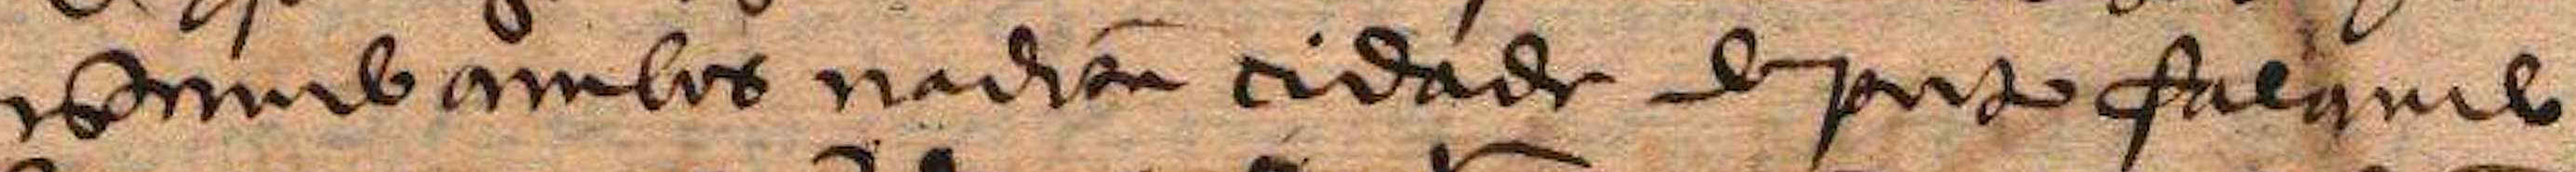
estando ambos na dita cidade do porto falando
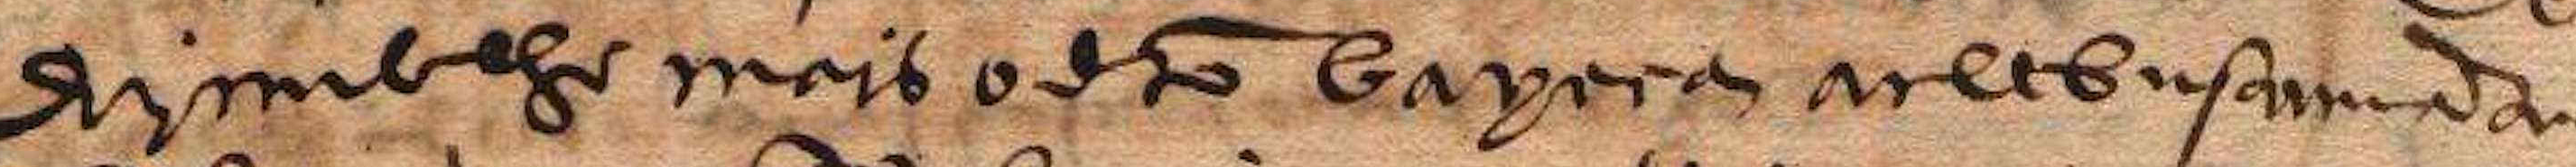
dizendolhe mais o dt̄o bayeça a elle bustamāte
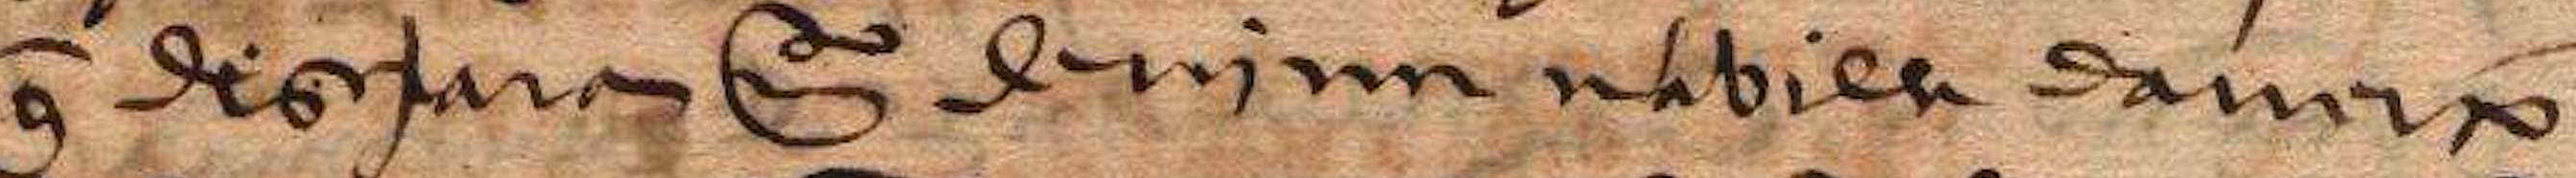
q̄ deseJara mto de ujuer na villa daueiro
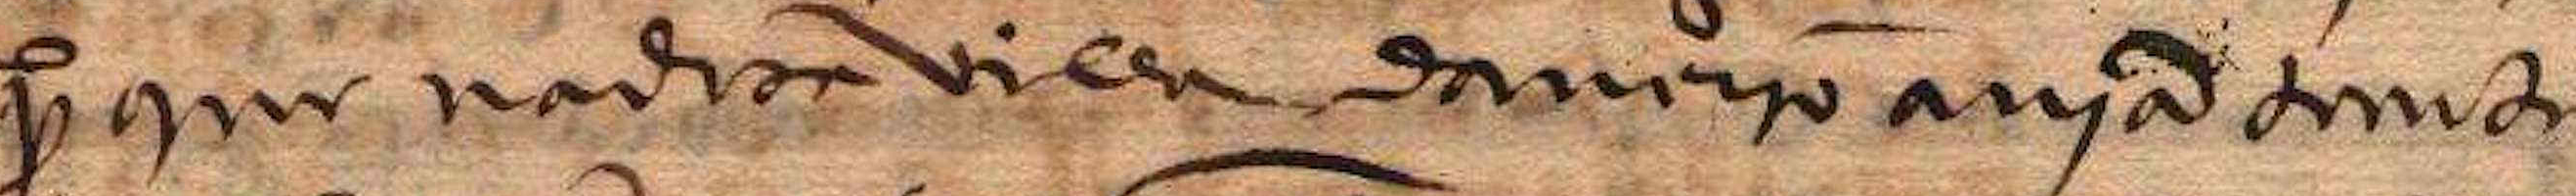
p̄oque na dita villa daueiro aujā tanta
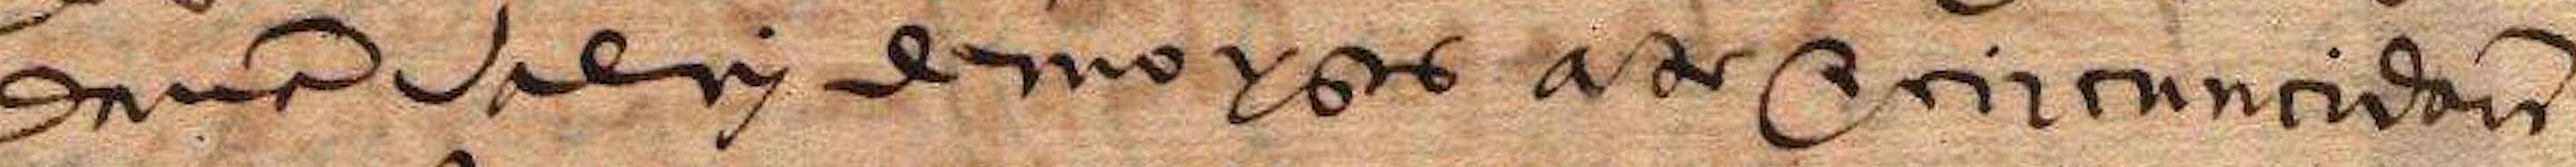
dauā a ley de moyses ate ē circunçidarē
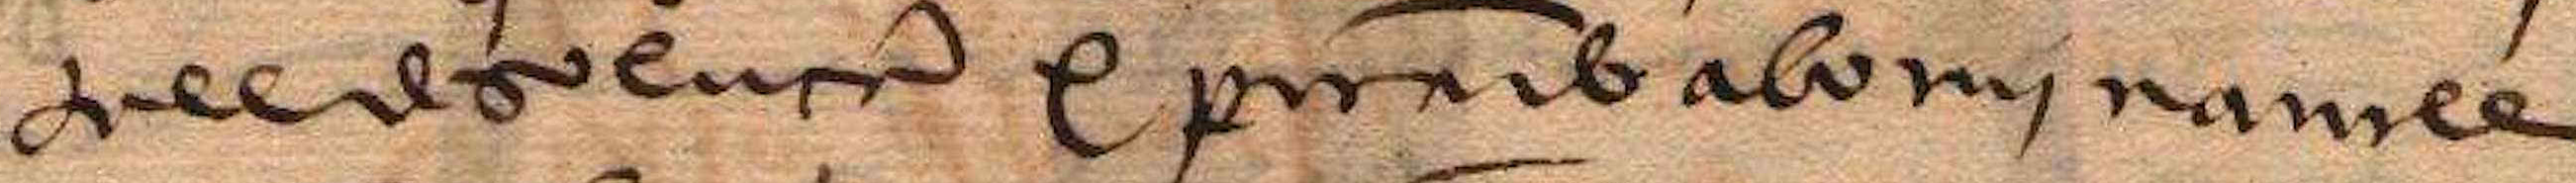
tall desoluçā e pcc̄ado abomjnauell
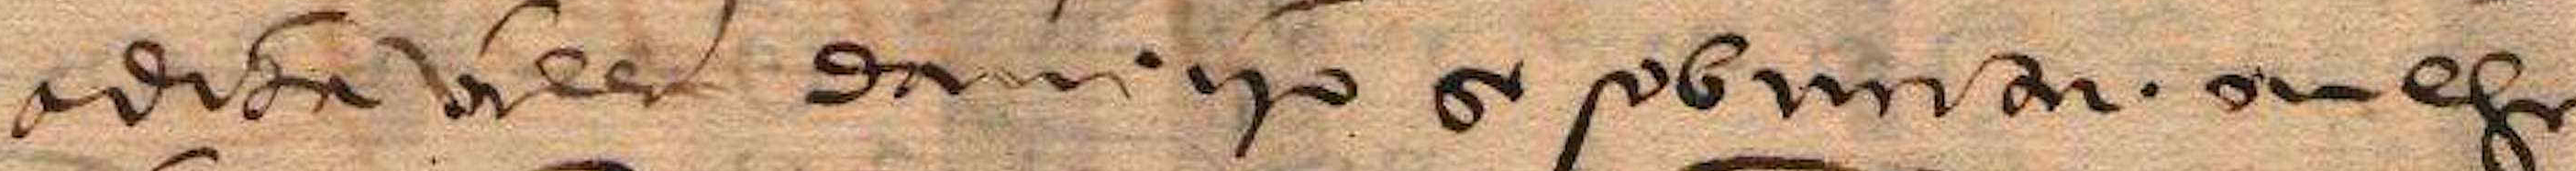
a dita villa daueiro se sobmeter. ou lhe
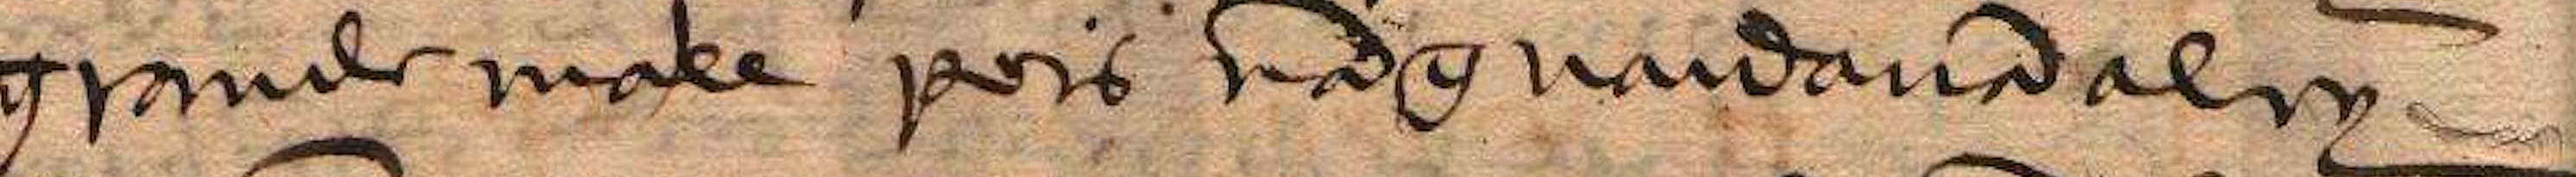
grande mall pois nā guardauā a ley
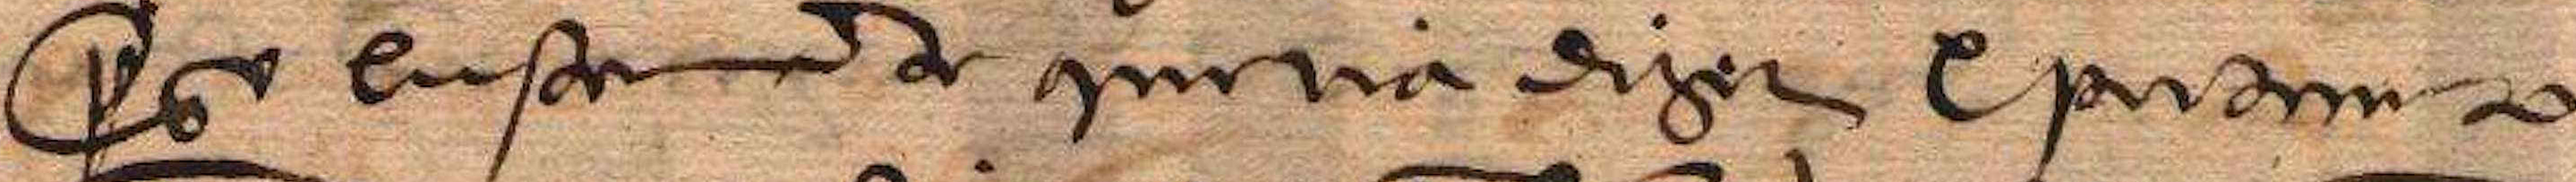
p̄so bustamāte queria dizer e portanto
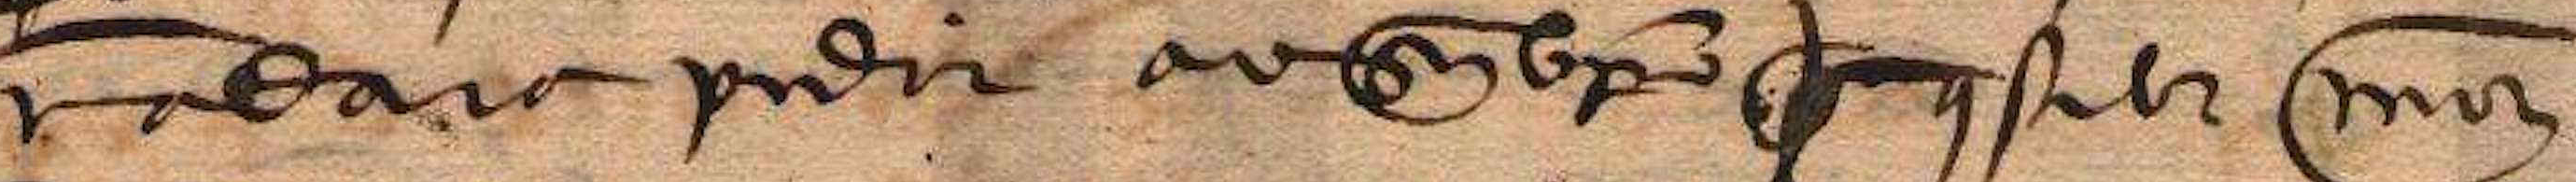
m̄adara pedir ao s̄r bpō Jnq̄sidor m̄or
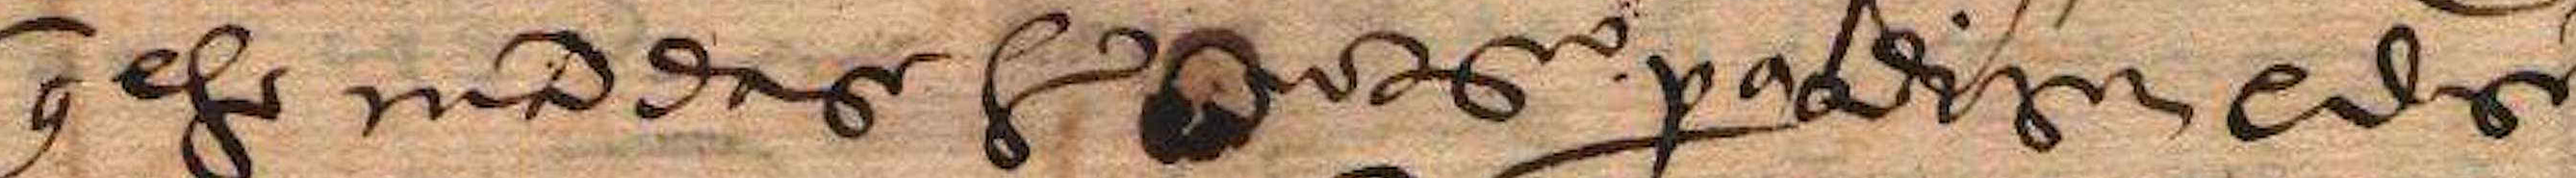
q̄ lhe mādase hū notro. ꝑa o dizer e desē
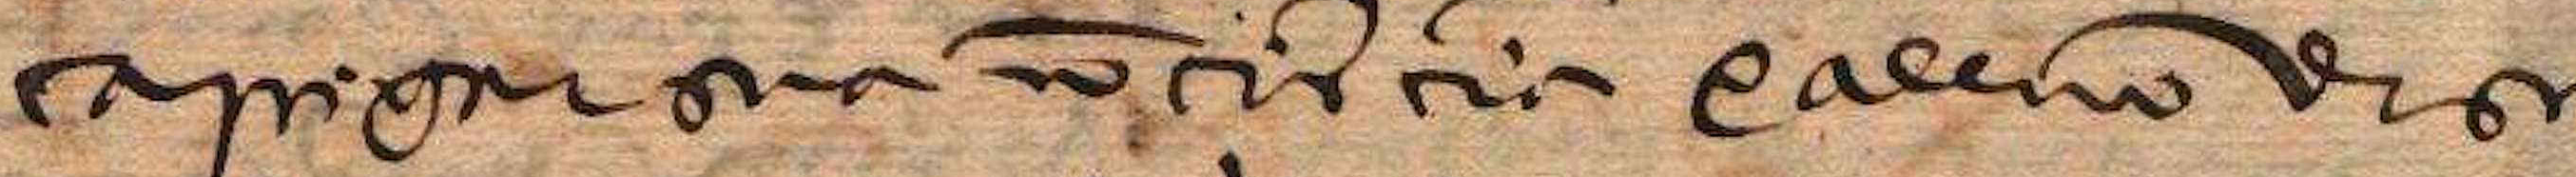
carregar sua c̄oçiēçia e all nō dise
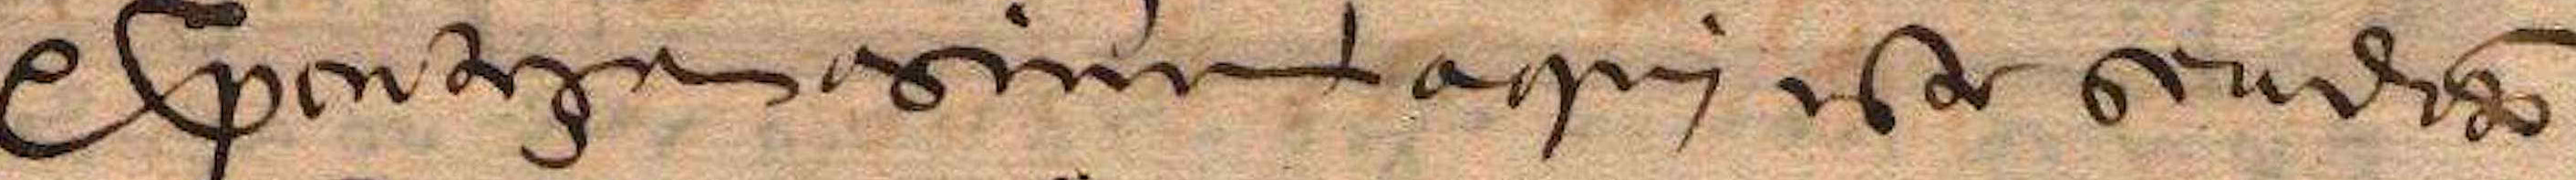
e p̄ certeza asinou aquj este seu dito
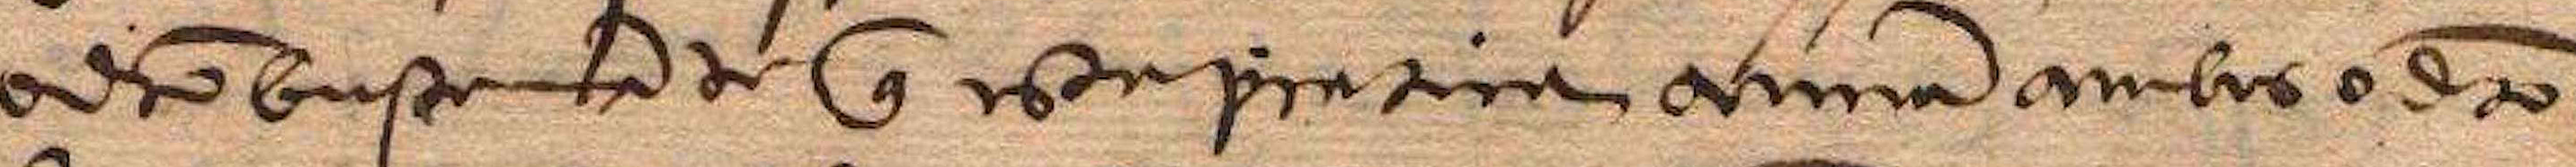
o dt̄o bustamāte q̄ esta pratica ouuerā ambos o dt̄o
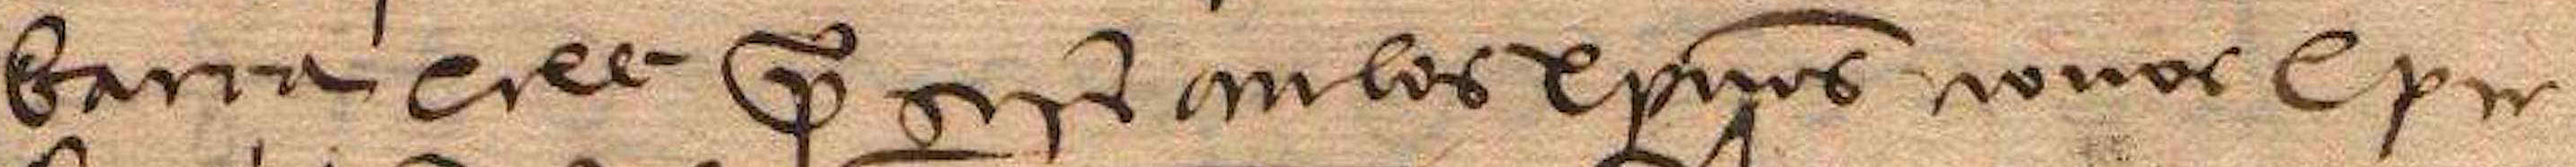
baeça e elle p̄o serē anbos xpãos nouos e pre
